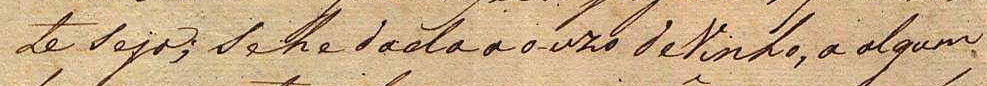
te seja, se he dada ao uzo de Vinho, a algum
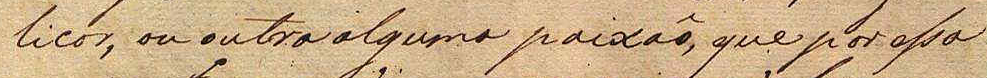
licor, ou outra alguma paixaõ, que por essa
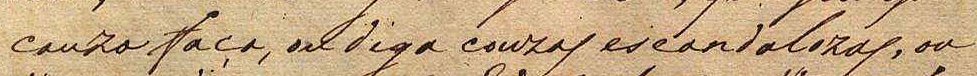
cauza faça, ou diga couzas escandalozas, ou
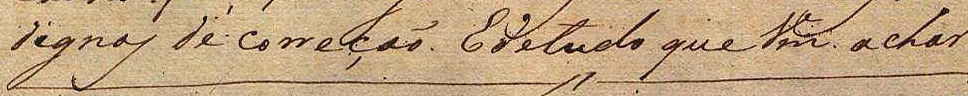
dignas de correçaõ. E de tudo que Vm. achar
